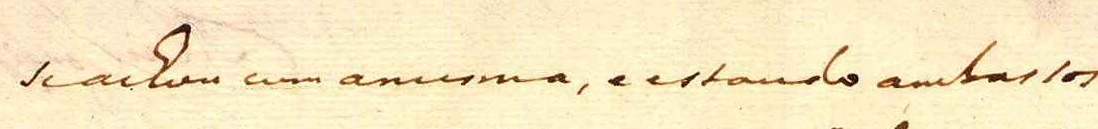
se achou com a mesma, e estando ambas sos
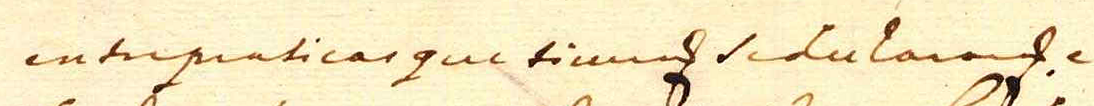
entre praticas que tiueraõ se declararaõ, e
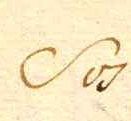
Sos
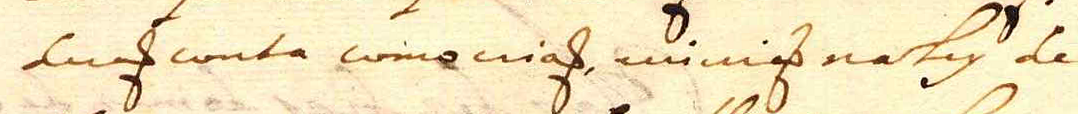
deraõ conta como criaõ, e uiuiaõ na Ley de
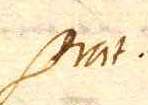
prat.
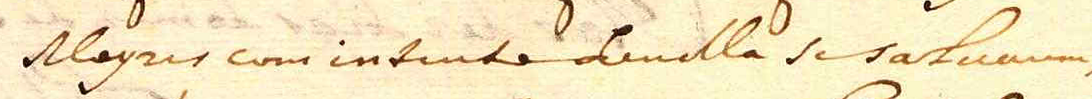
Moyzes com intento de nella se saluarem,
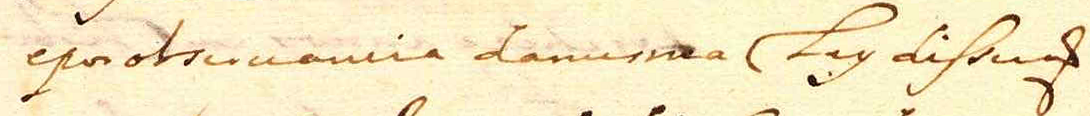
e por obseruancia da mesma Ley disseraõ
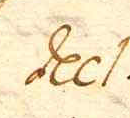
decl.
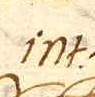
int.
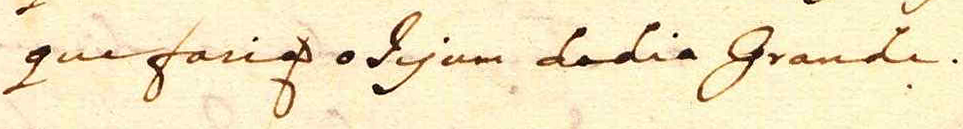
que faziaõ o Iejum do dia Grande.
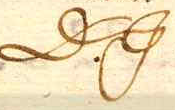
D.G.
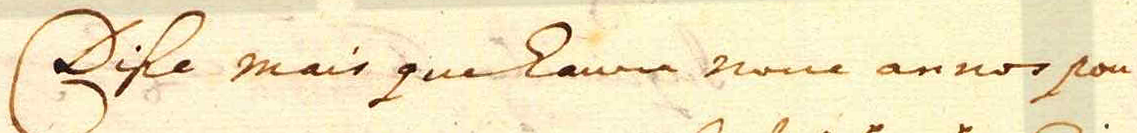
Disse mais que hauera noue annos pou
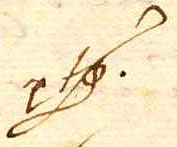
e tp.o
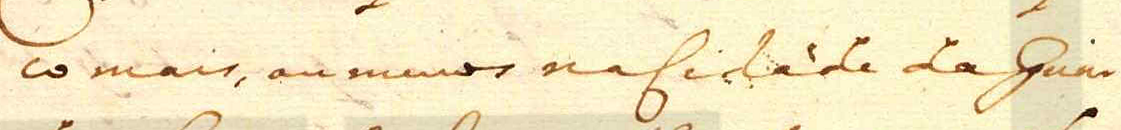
co mais, ou menos na Cidade da Guar
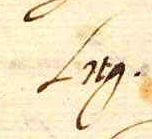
Lug.
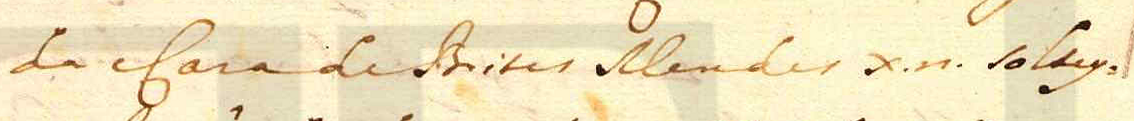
da e Caza de Brites Mendes x. n. soltey.
